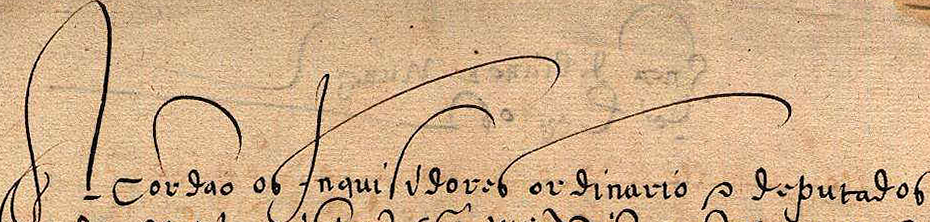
ACordão os Jnquisidores ordinario e deputados
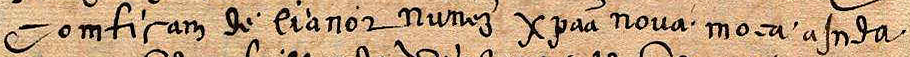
Comfisam de lianor nunez̄ xpaā noua moça aJnda
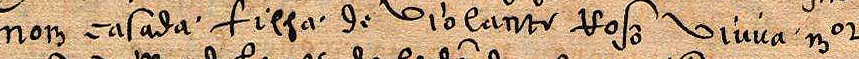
nom casada filha de Violante RoJz̄ Viuua mor
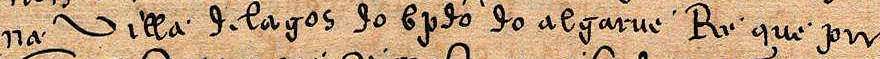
na Villa de lagos do bpdō do algarue Re que pre
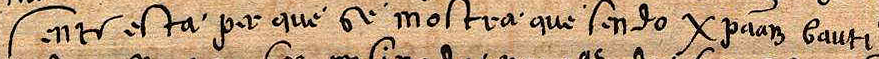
sente está per que se mostra que sendo Xpaām bauti
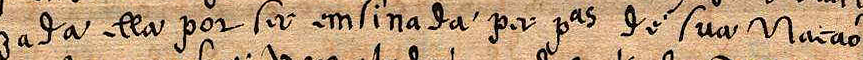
zada ella por ser emsinada per pas de sua Naçaõ
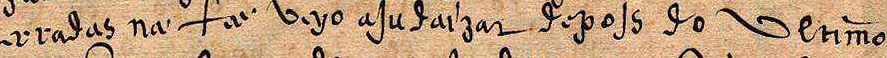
erradas na fee veyo a Judaizar depoJs do Vltimo
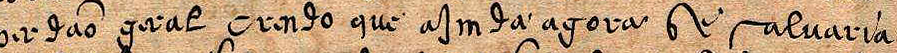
perdaõ geral crendo que aJmda agora se saluaria
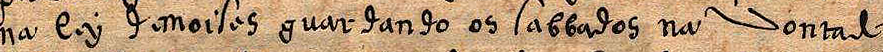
na ley de moises guardando os sabbados na Vontade
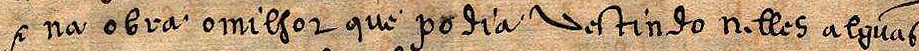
e na obra o milhor que podia Vestindo nelles algūas
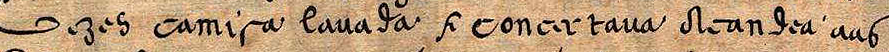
Vezes camisa lauada e conçertaua A candea aas
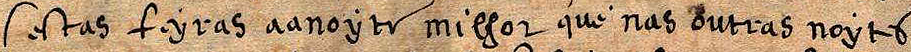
sestas feyras aa noyte milhor que nas outras noytes
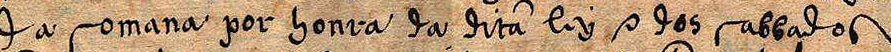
da somana por honra da ditā ley e dos sabbados
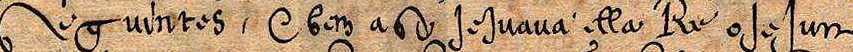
seguintes / e bem asy JeJuaua ella Re o JeJum
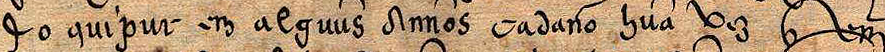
do quipur em alguūs Annōs cadanō huā vez Sem
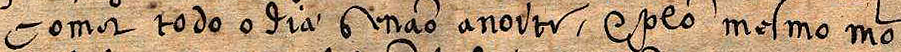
Comer todo o dia senaõ a noite, e plō mesmo mo
